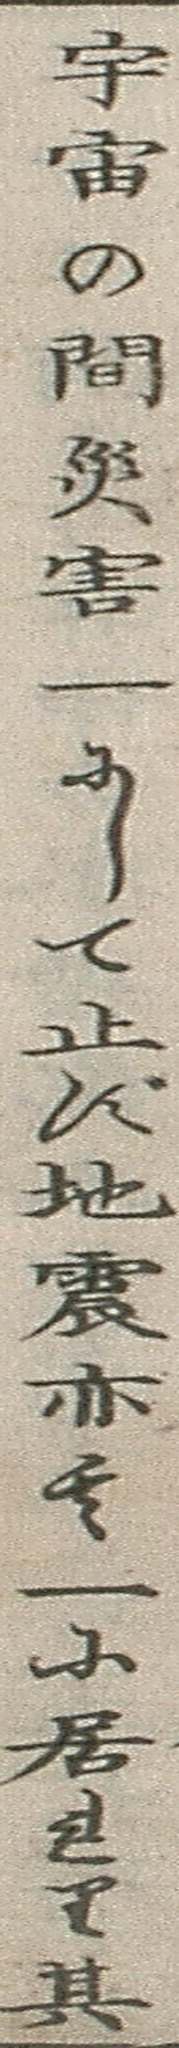宇宙の間災害一にして止ず地震亦其一に居れり其
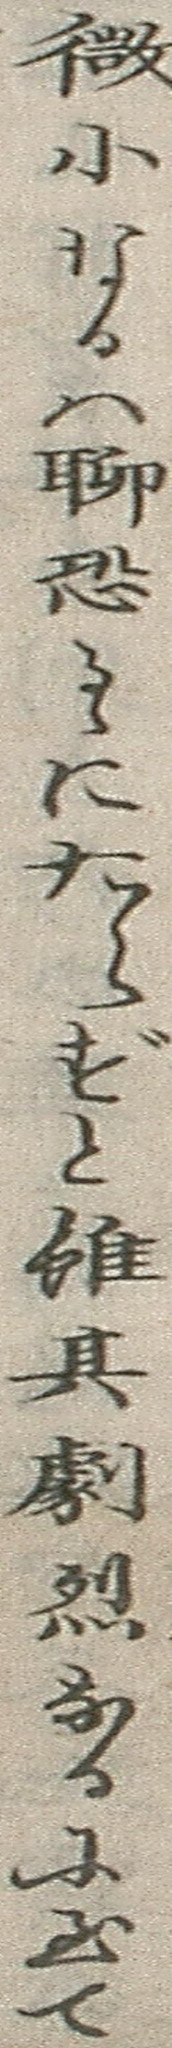微小なるは聊恐るるにたらずと雖其激烈なるに至て
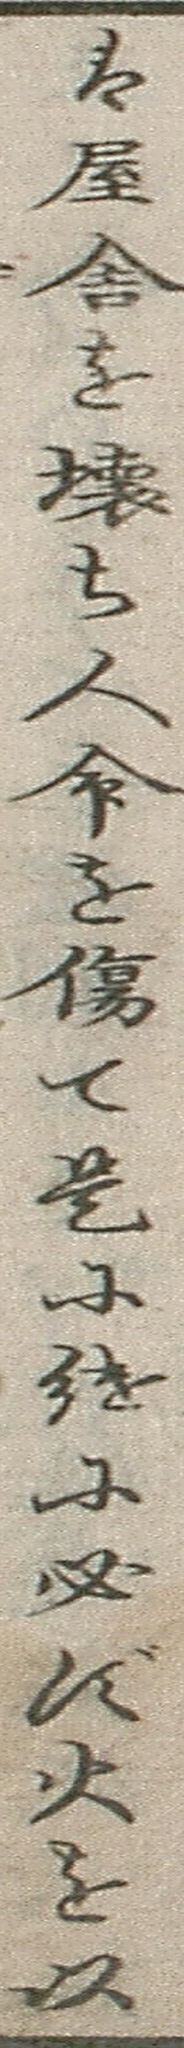は屋舎を壊ち人命を傷て是に継に必ず火を以
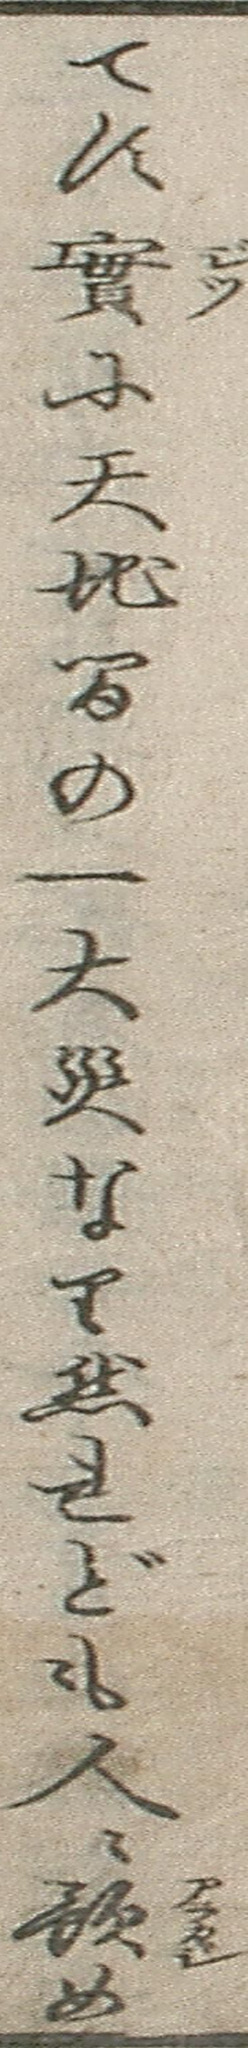てす実に天地間の一大災なり然れども人〻予め
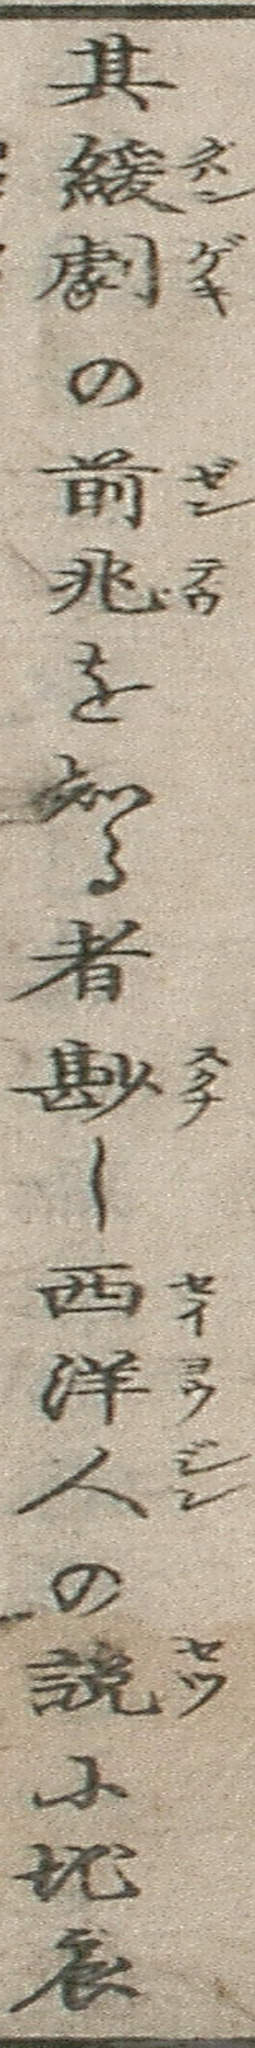其緩劇の前兆を知る者少し西洋人の説に地震
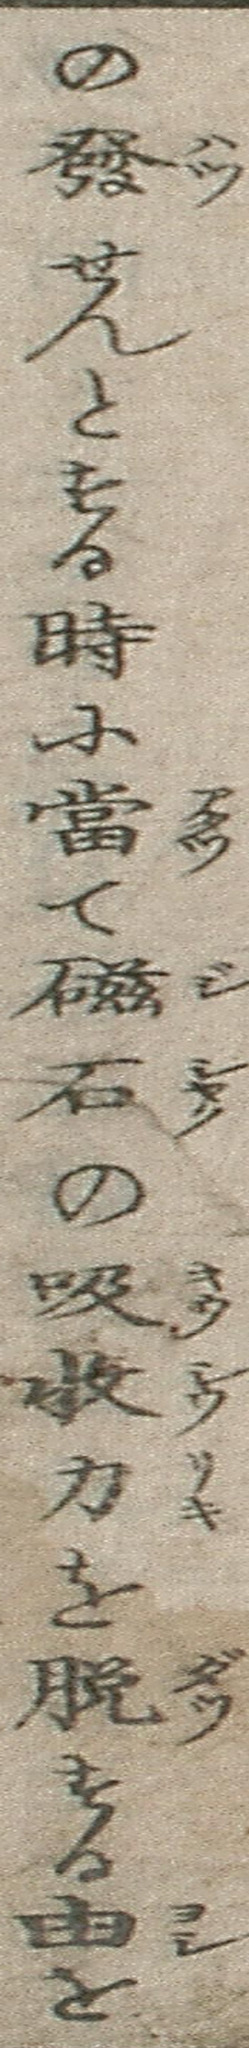の発せんとする時に当て磁石の吸収力を脱する由を

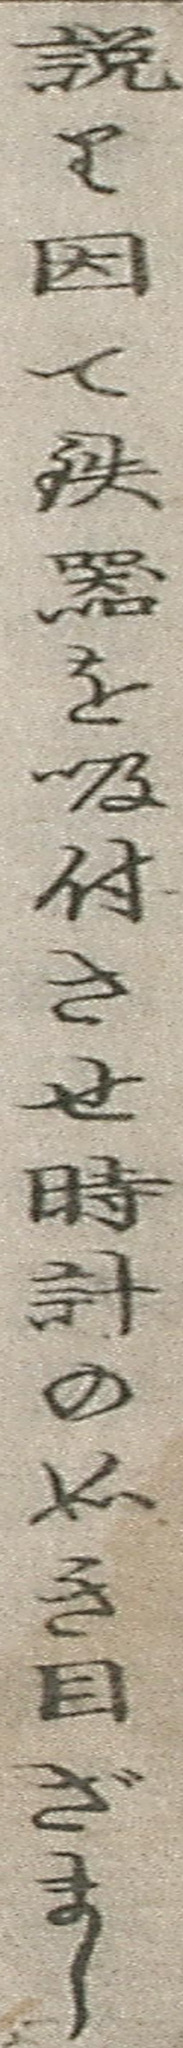説り因て鉄器を吸付させ時計の如き目ざまし
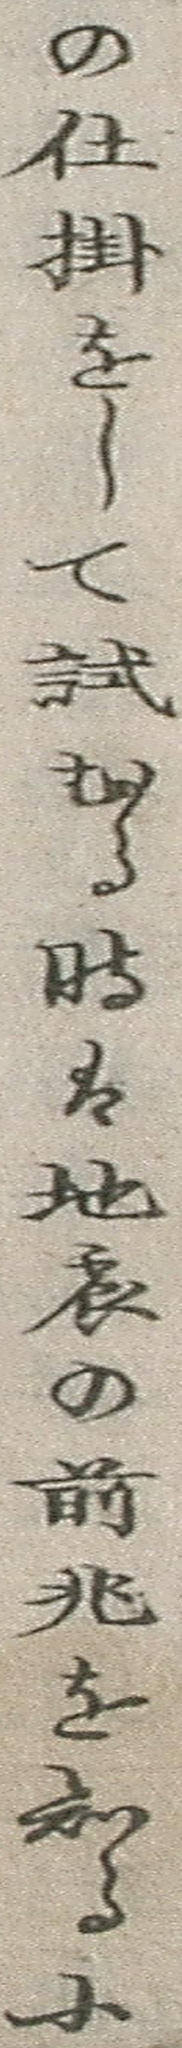の仕掛をして試むる時は地震の前兆を知るに
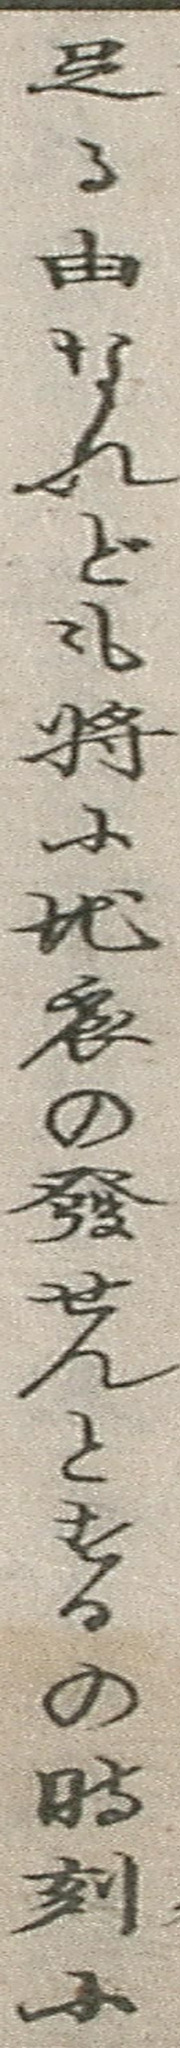足る由なれども将に地震の発せんとするの時刻に
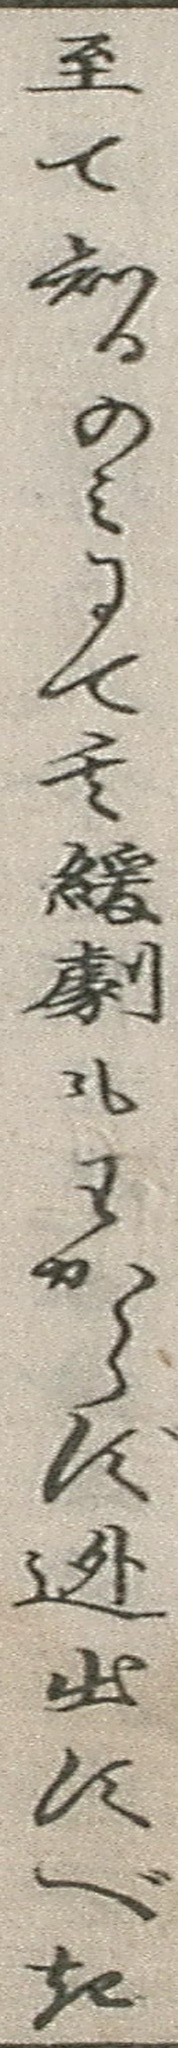至て知るのみにて其緩劇もわからず逃出すべき
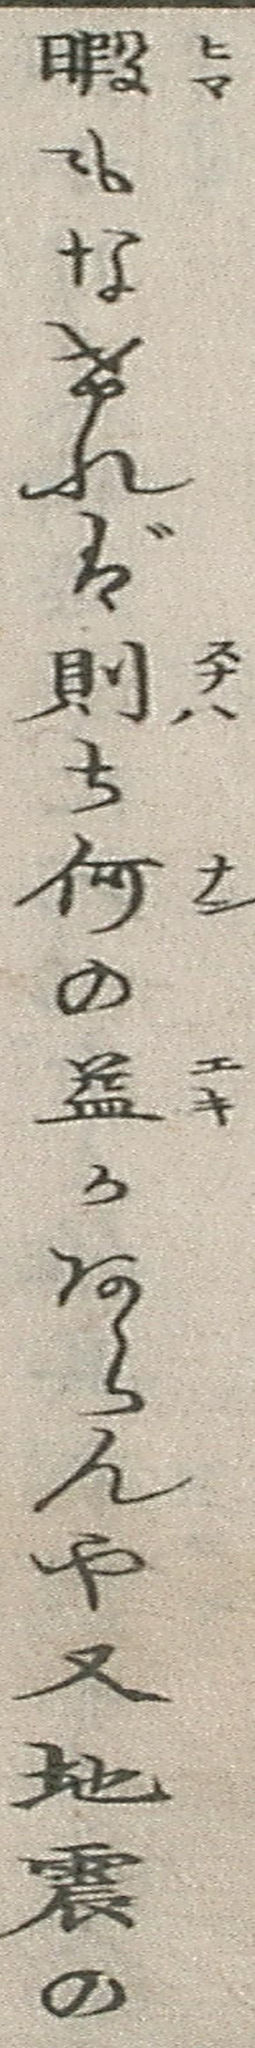暇もなければ則ち何の益かあらんや又地震の
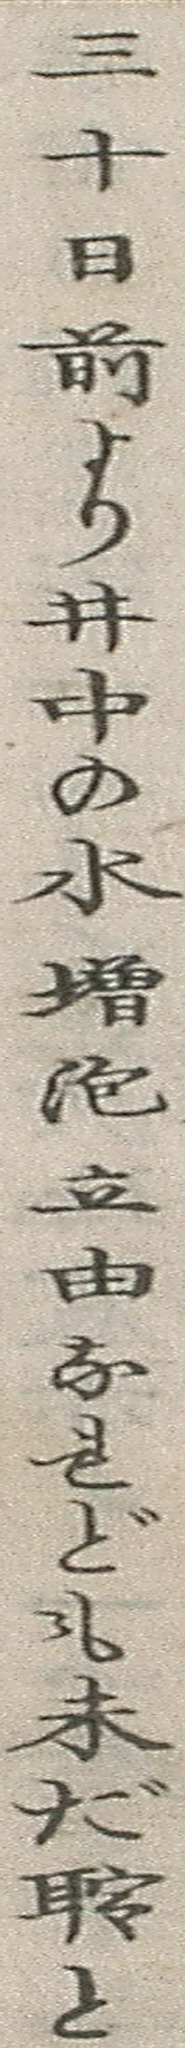三十日前より井中の水増泡立由なれども未だ聢と
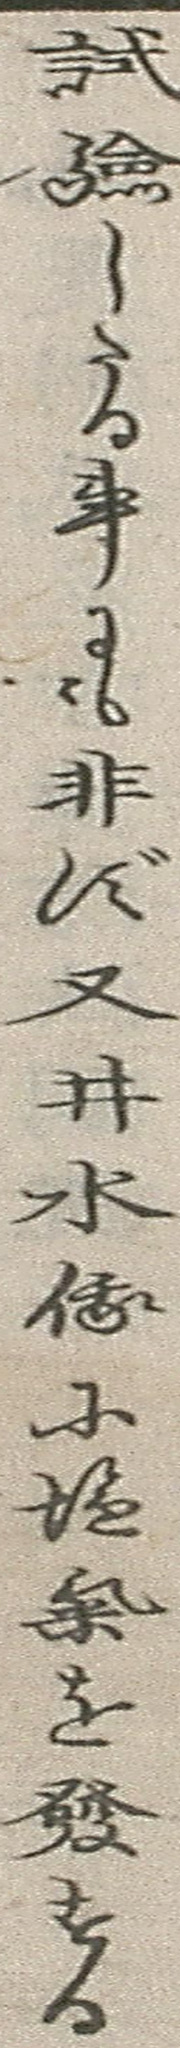試験したる事にも非ず又井水俄に塩気を発する
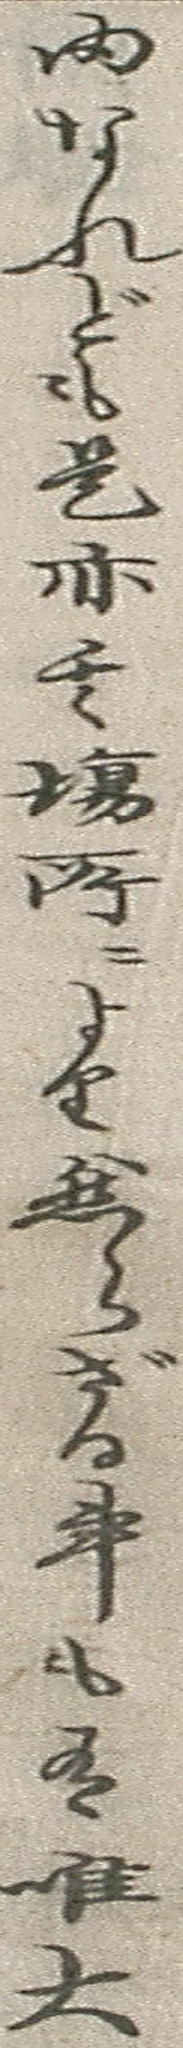由なれども是亦其場所然らざる事も有唯大
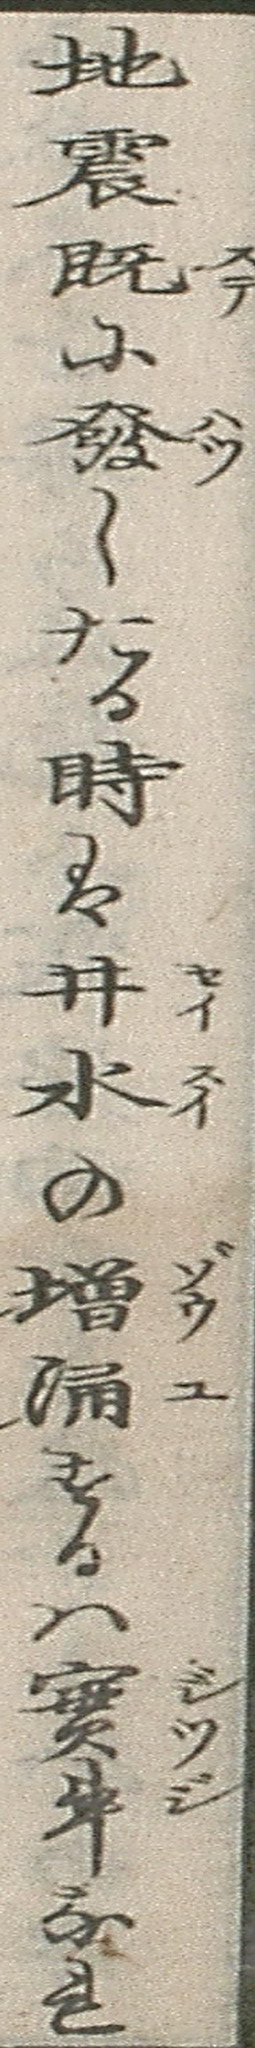地震既に発したる時は井水の増涌するは実事なれ
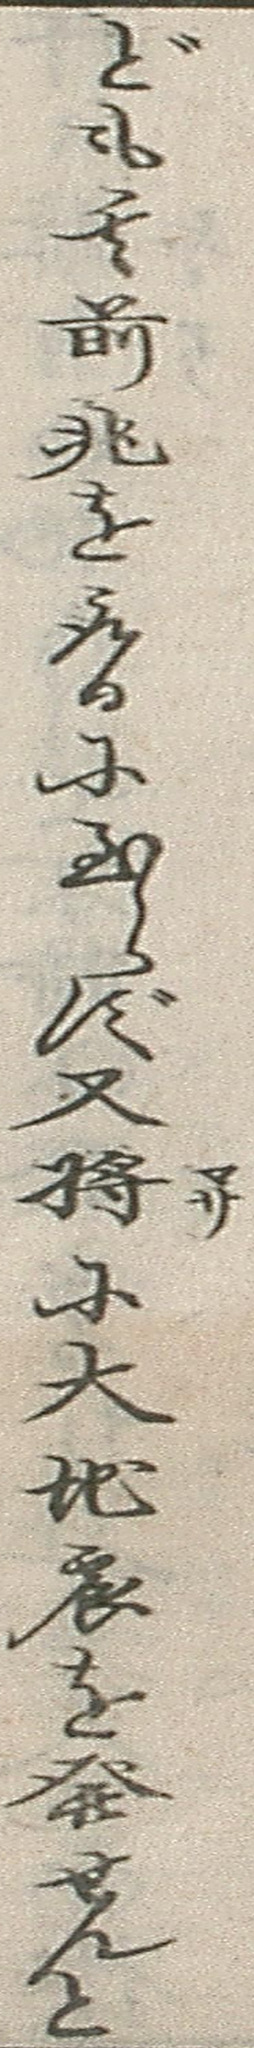ども其前兆を取るに至らず又将に大地震を発せんと
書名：附録　地震劇風災害豫防法圖説（内題）
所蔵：東京大学地震研究所図書室 Earthquake Research Institute Library, The University of Tokyo, JAPAN
